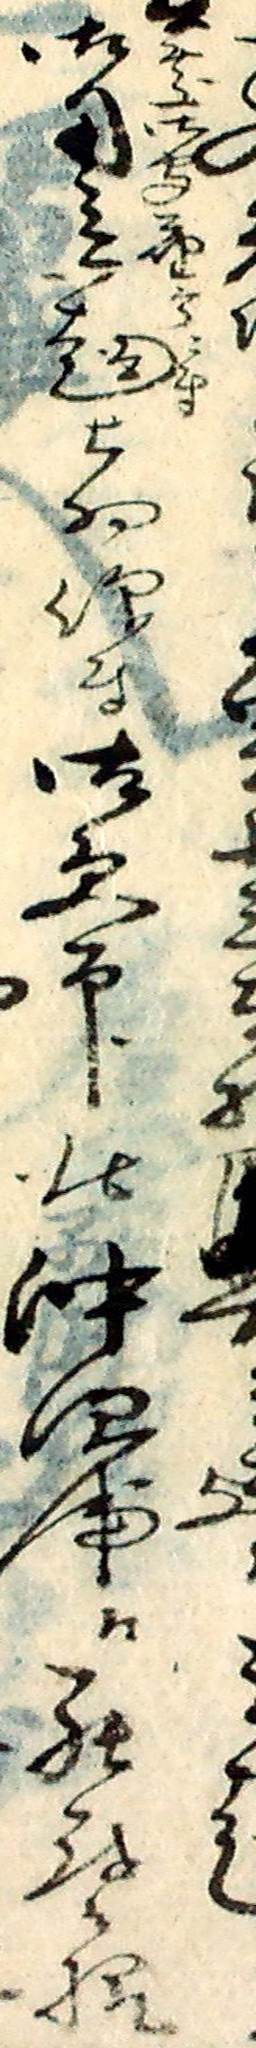御用之趣被為仰付御受印仕沖次浦え罷越候様
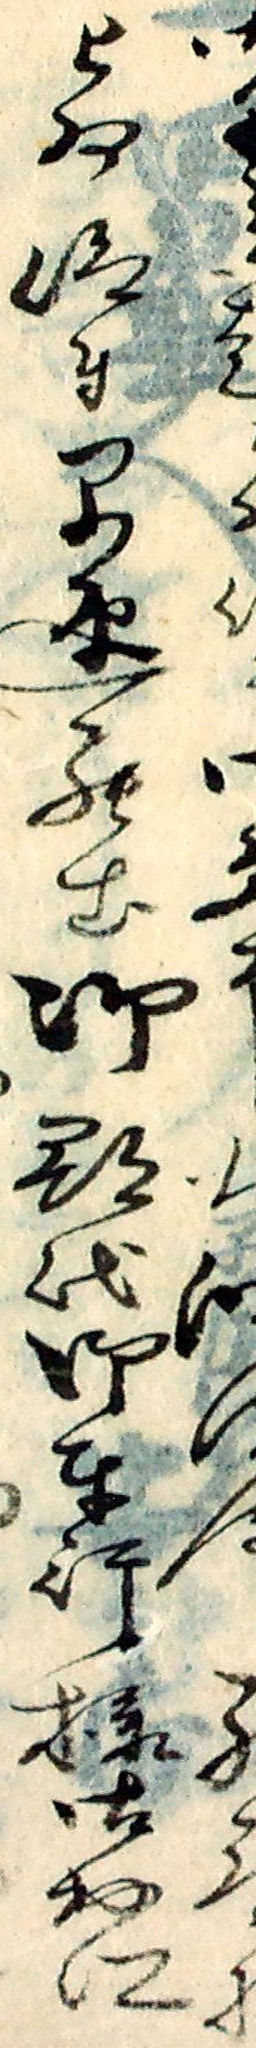被為仰付早速罷出御郡代御奉行様御出郷
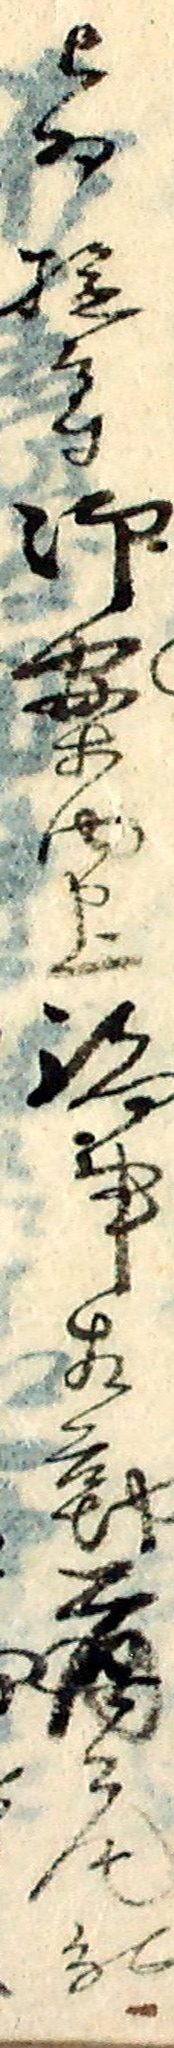被為遊候付御案内申上諸事相勤首尾能
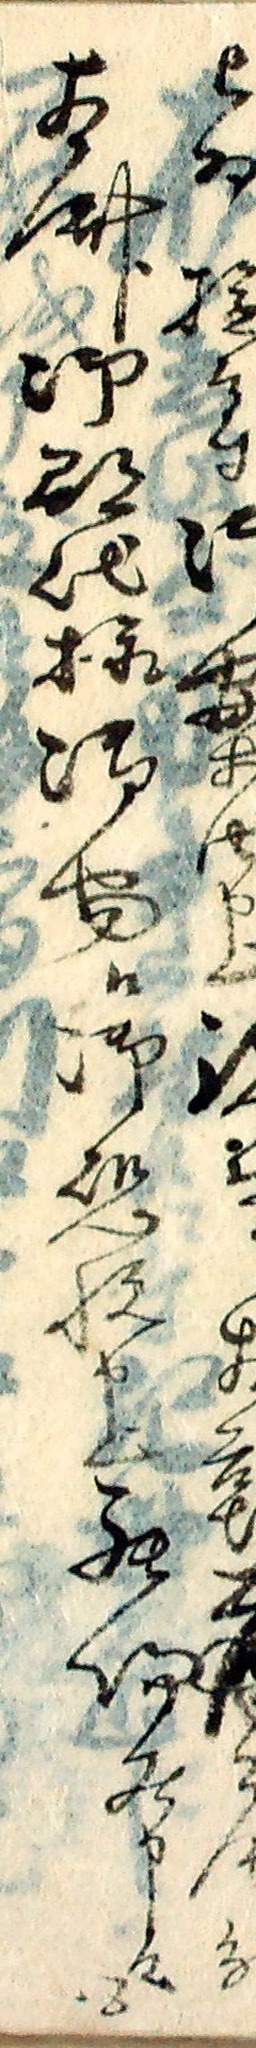相済御郡代様御宅え御恐悦申上罷帰居申候以上
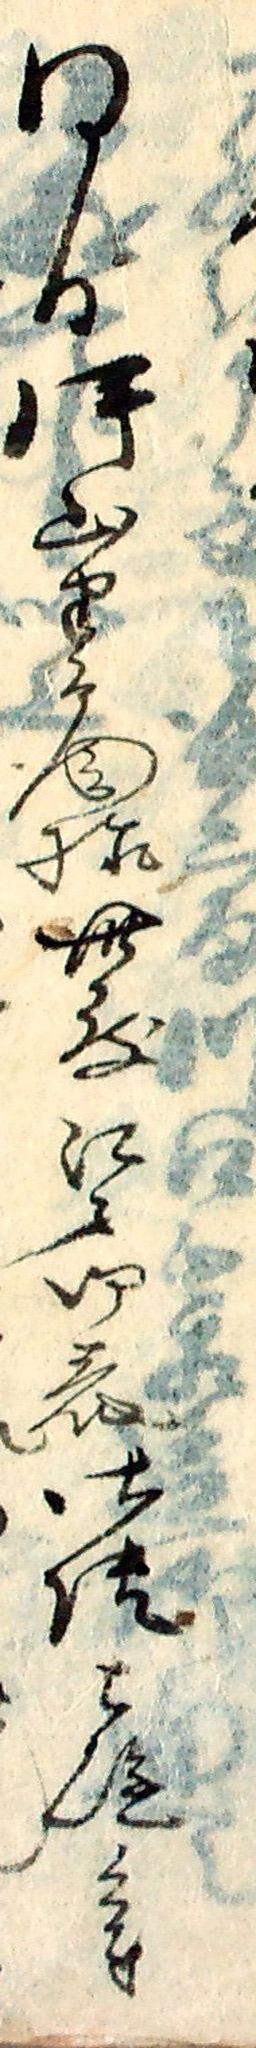同日伊山半兵衛様此度江戸御表御供被遊候付
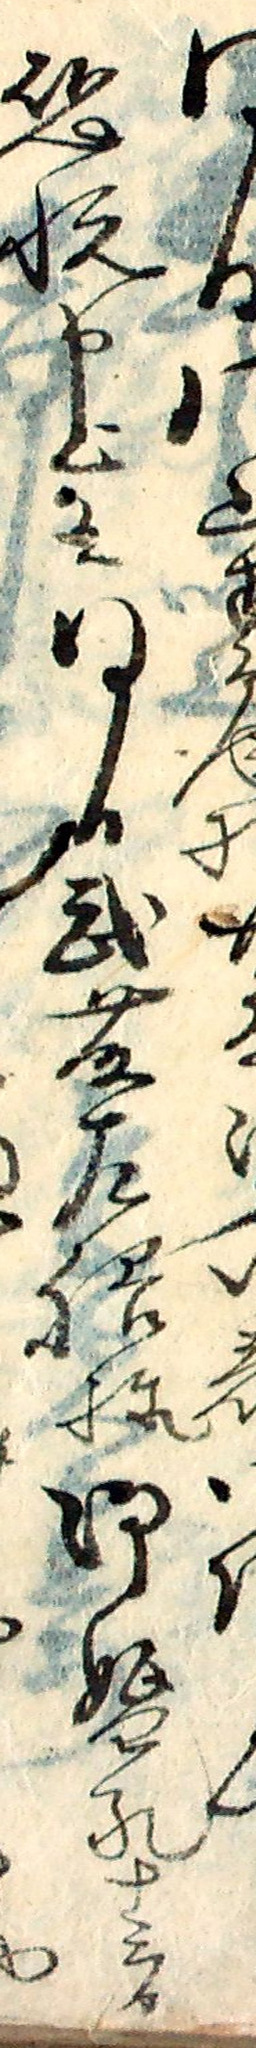恐悦申上候同日武藤左膳様御婚礼十三日
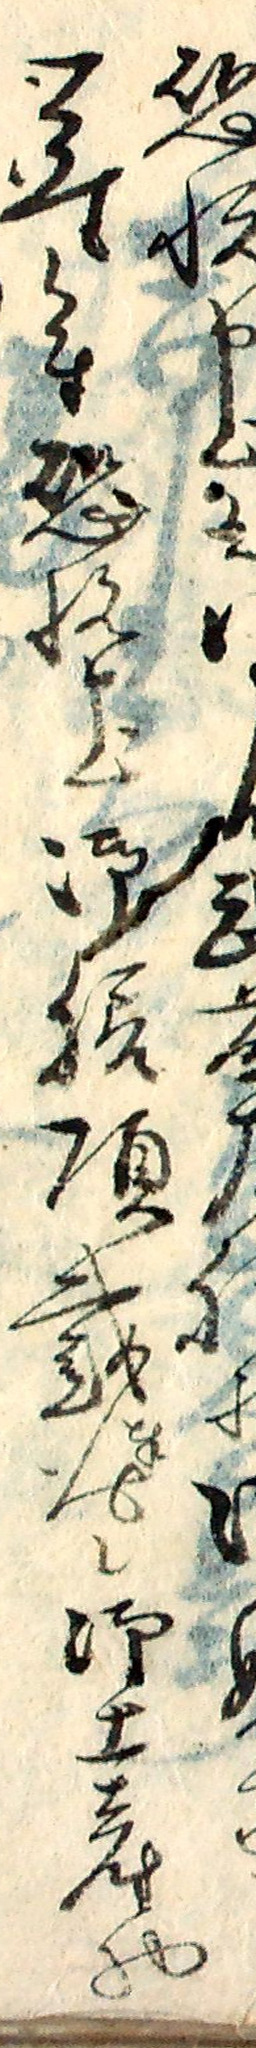御座候付恐悦申上御膳頂戴奉仕候御土産物
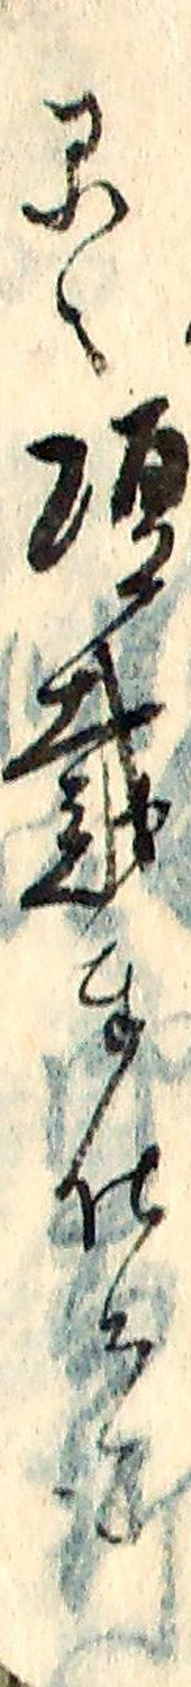品々頂戴奉仕候以上

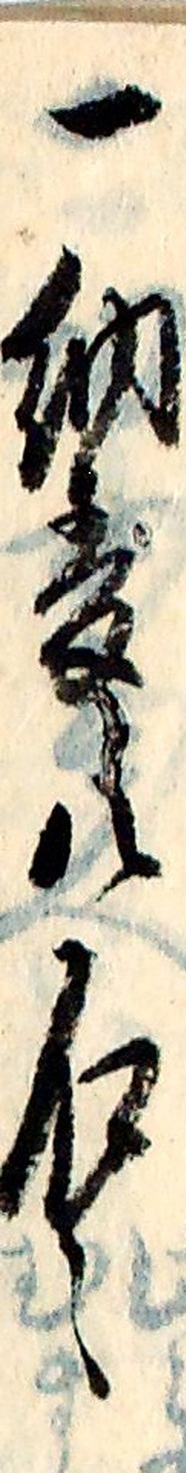一納麦八石也
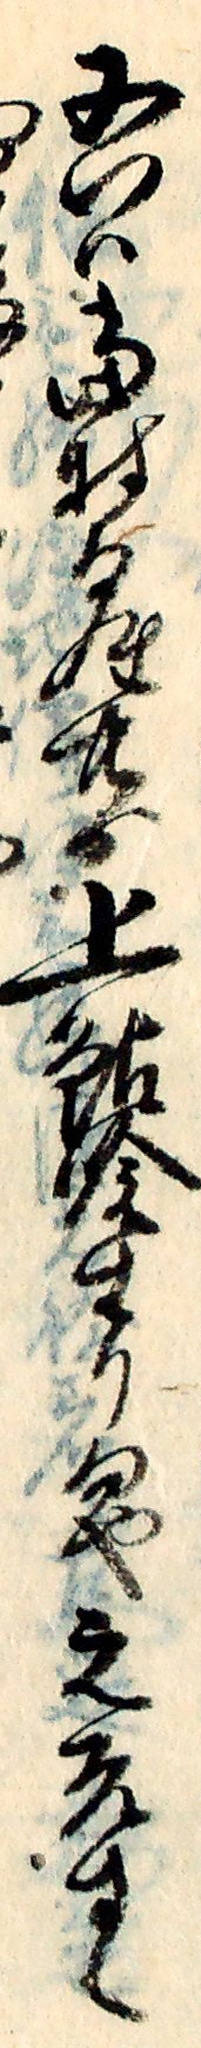右は当村百姓共ゟ上鮎喰はりまや元吉方へ
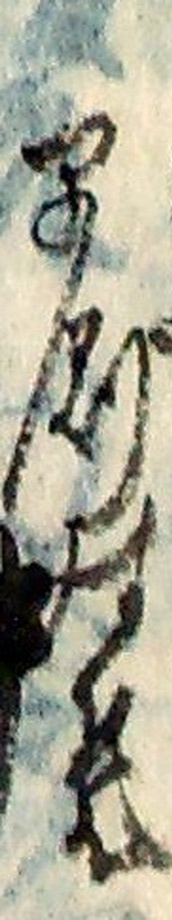早淵村庄屋
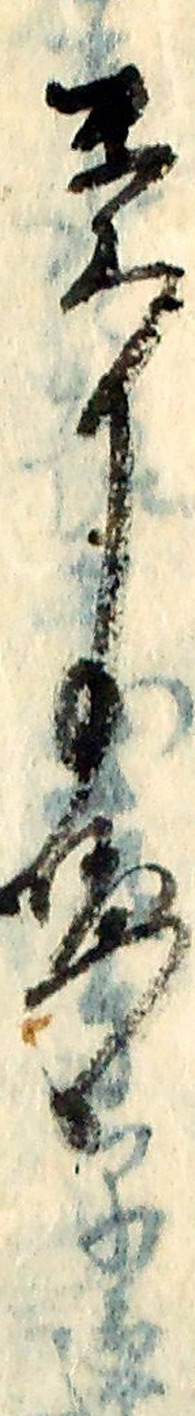未三月晦日
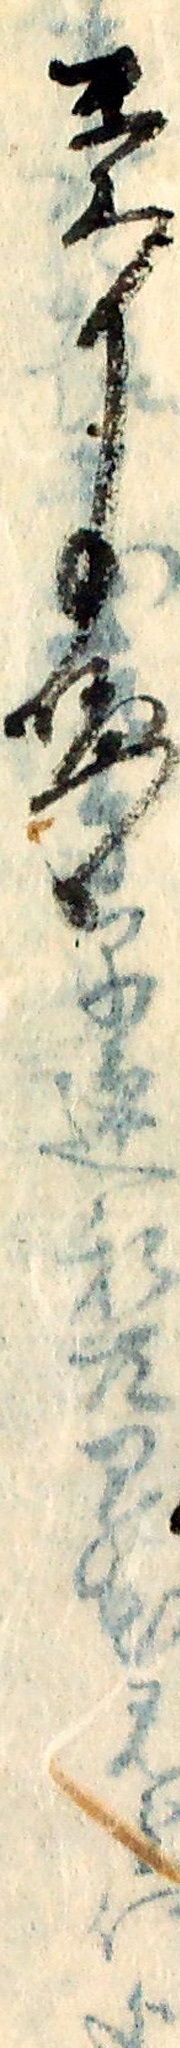未三月晦日
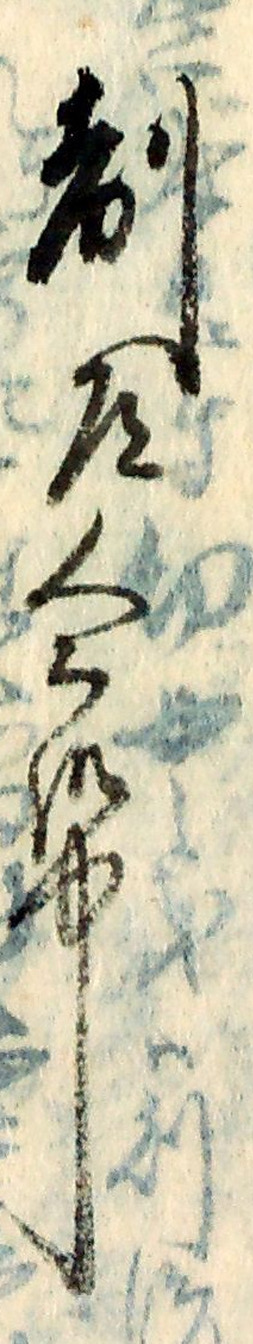制道人衆中
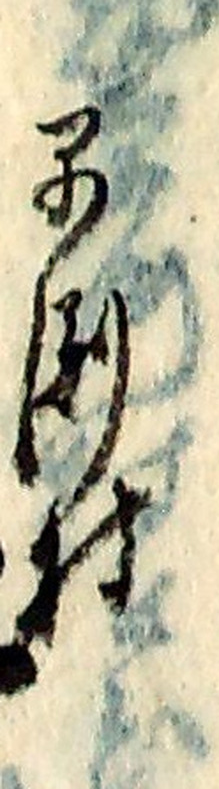早淵村
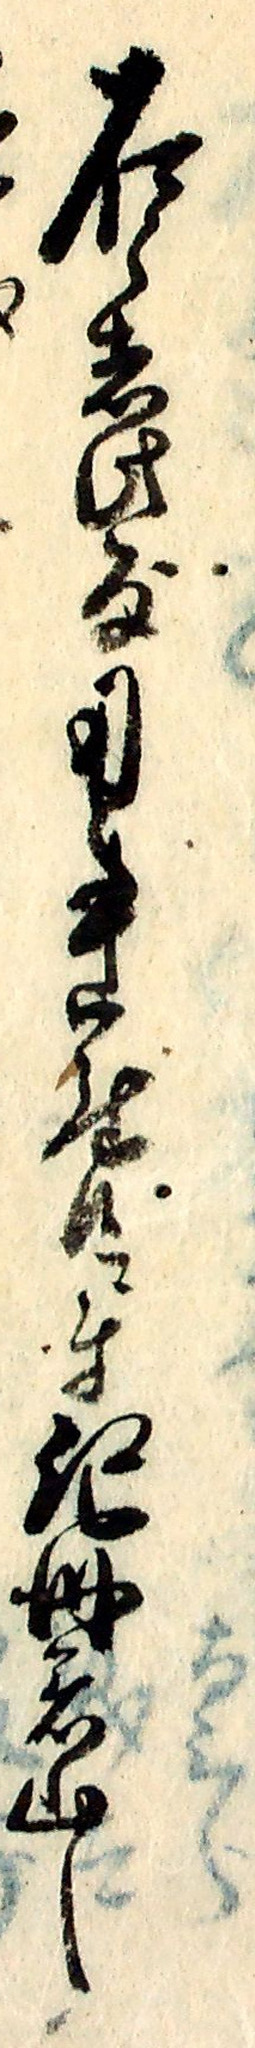右の者此度用事御座候に付紀州若山へ
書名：諸御願書控(後藤氏壱番）
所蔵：鳴門教育大学 Naruto University of Education
